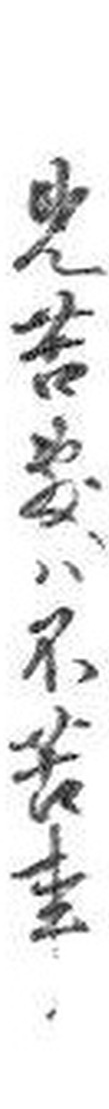見苦敷ハ不苦事
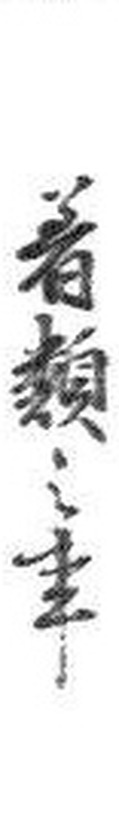一着類之事
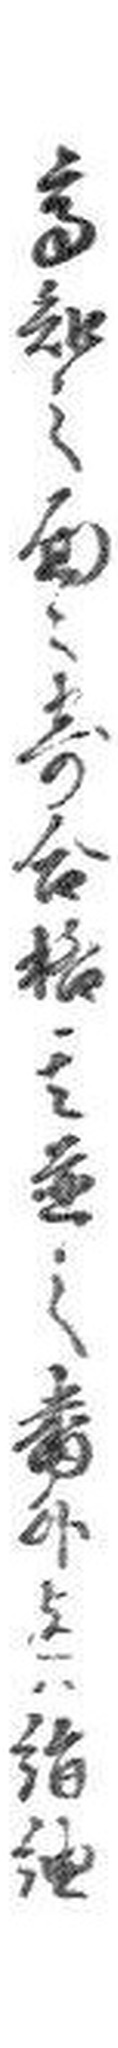高知之面々寄合格其並之番外迄ハ絹紬
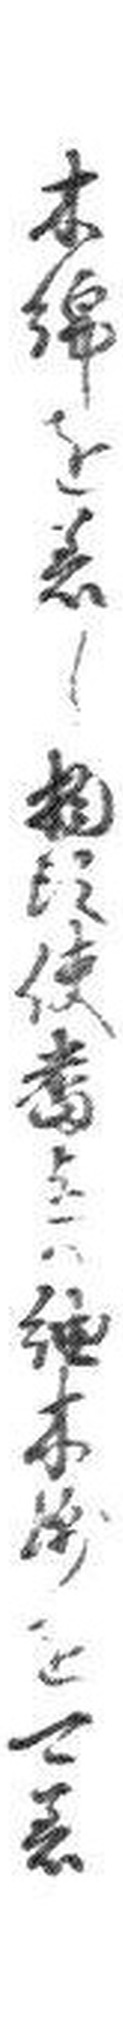木綿を着し物頭使番迄ハ紬木綿を可着
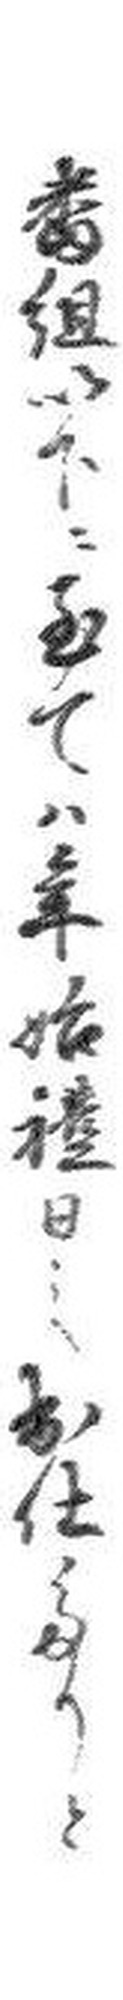番組以下ニ至てハ年始礼日之出仕たりと
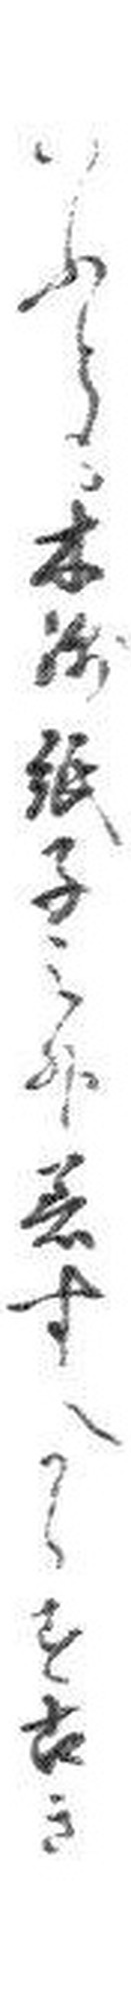いふとも木綿紙子之外着すへからす古き
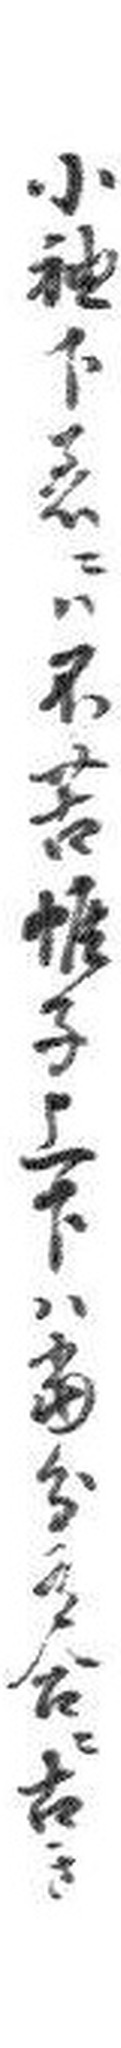小袖下着ニハ不苦帷子上下ハ当分有合ニ古き
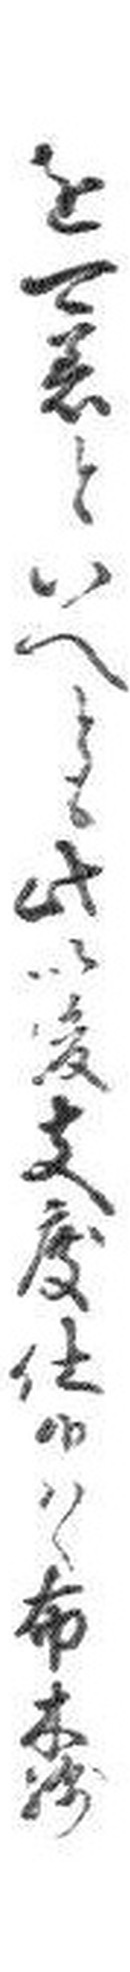を可着といへとも此以後支度仕候ハヽ布木綿
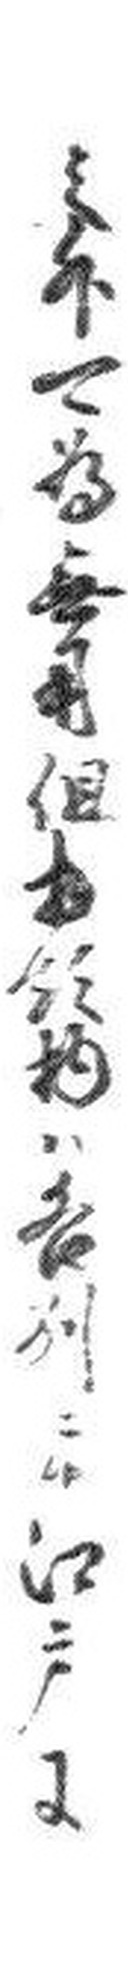之外可為無用但拝領物ハ各別ニ候江戸に
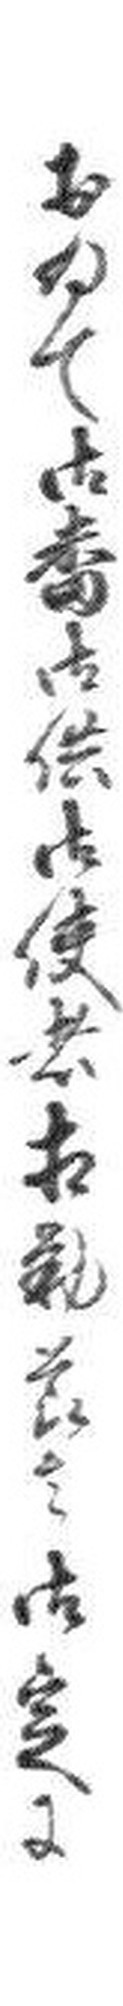おゐて御番御供御使者相勤節者御定に

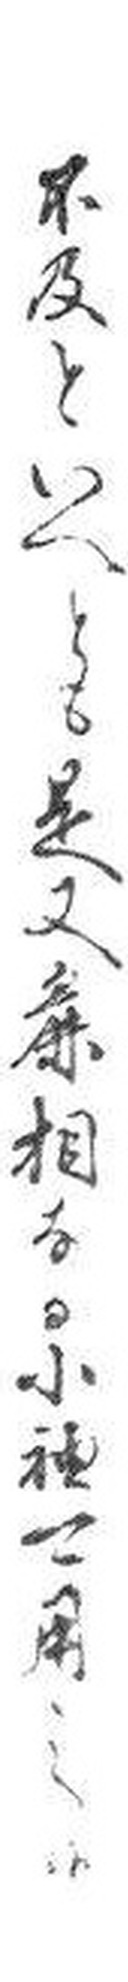不及といへとも是又麁相なる小袖可用之候
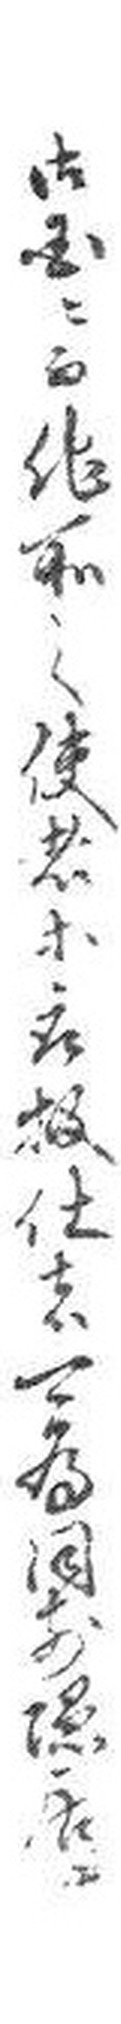御国ニ而他所之使者等取扱仕者可為同前隠居并
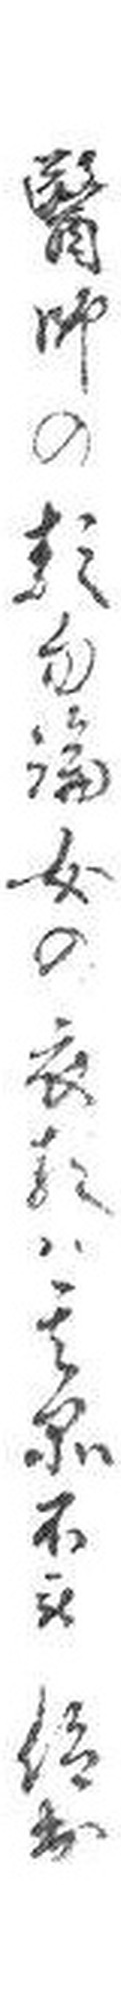医師之類勿論女の衣類ハ其品被不被仰出
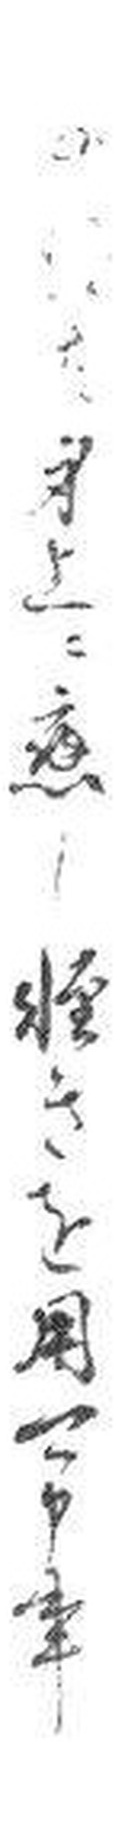候得共身上ニ応し軽きを用可申事
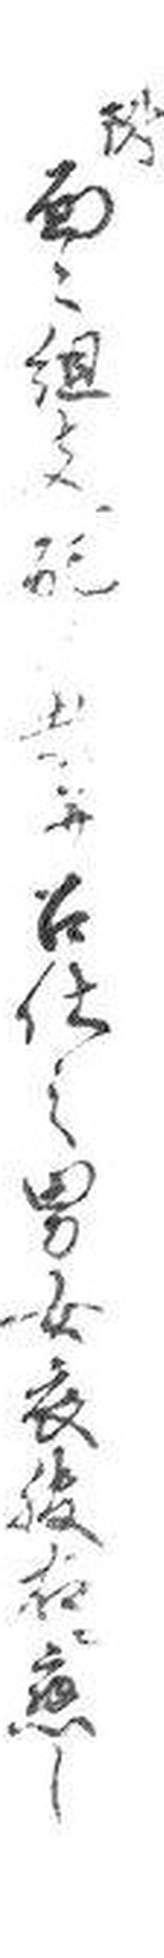面々組支配并召仕之男女衣服右ニ応し
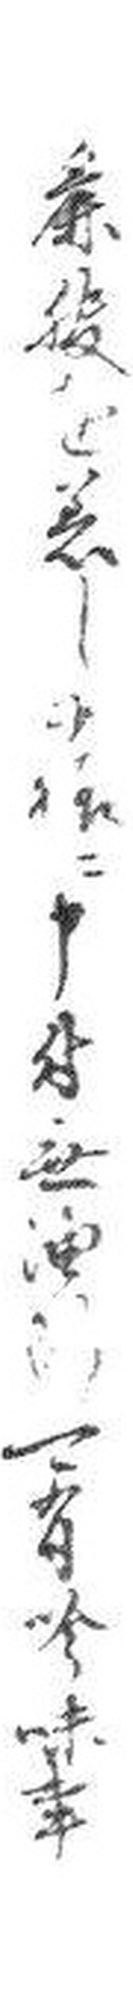麁服を着し候様ニ申付無油断可有吟味事
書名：家譜 二十八 吉邦公 従宝永七年七月五日到正徳元年十二月
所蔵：福井県文書館 Fukui Prefectural Archives
